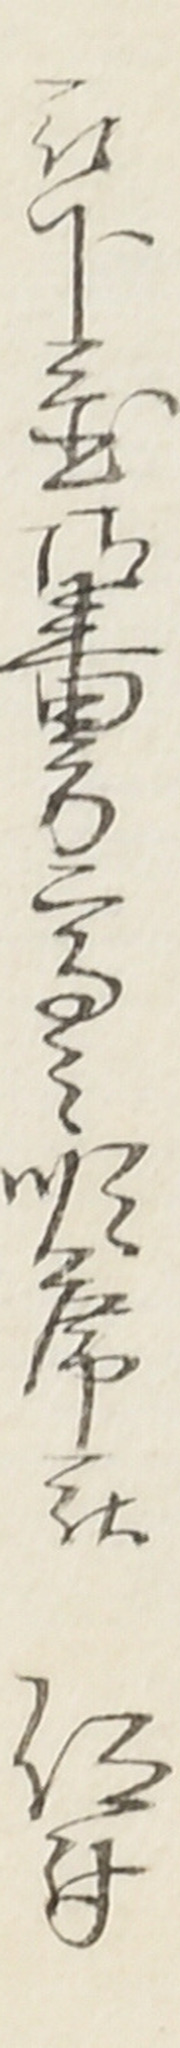被下置御番方高之順席被仰付
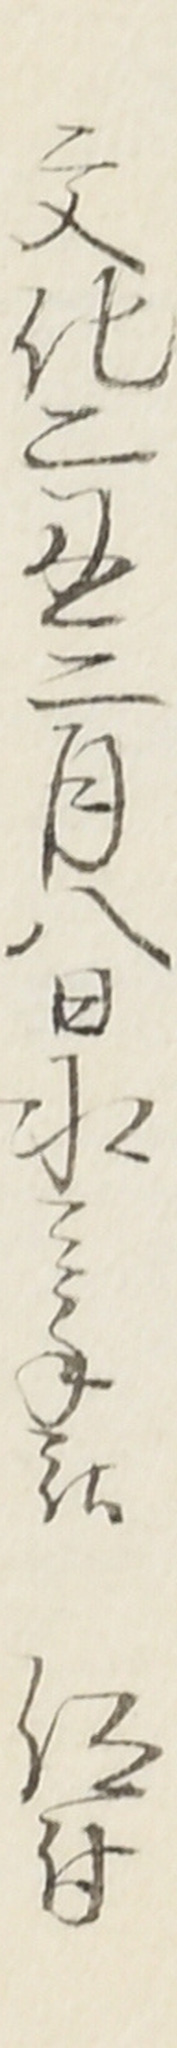一文化二丑二月八日水之手被仰付
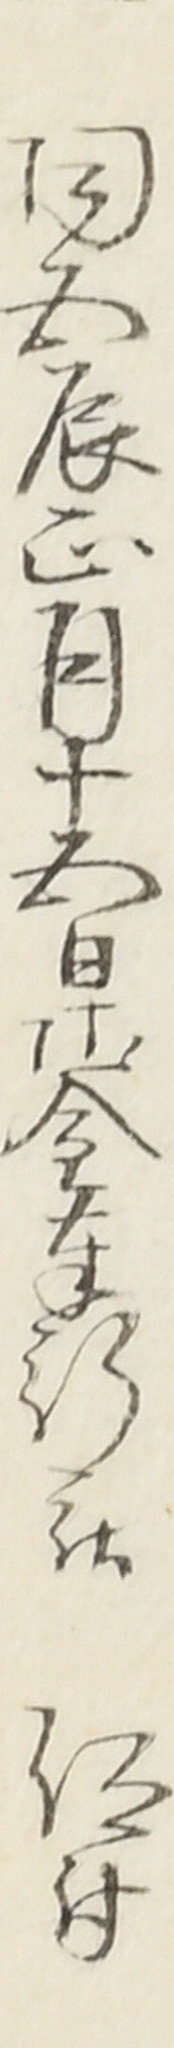一同五辰正月十五日御金奉行被仰付
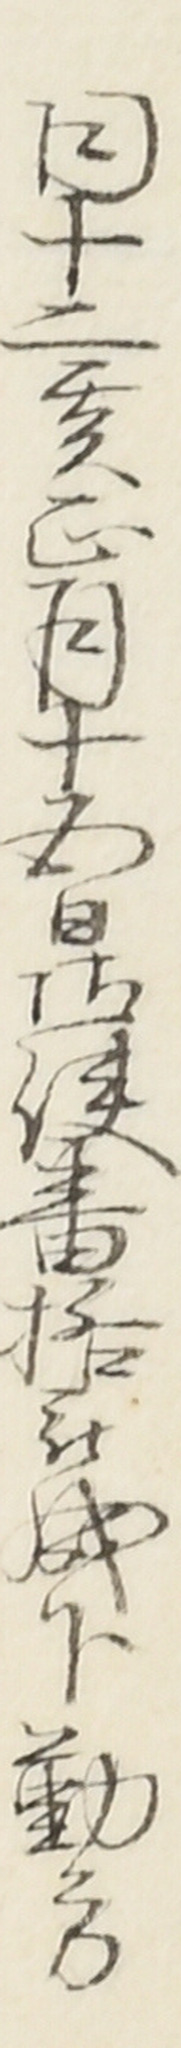一同十二亥正月十五日御使番格被成下勤方

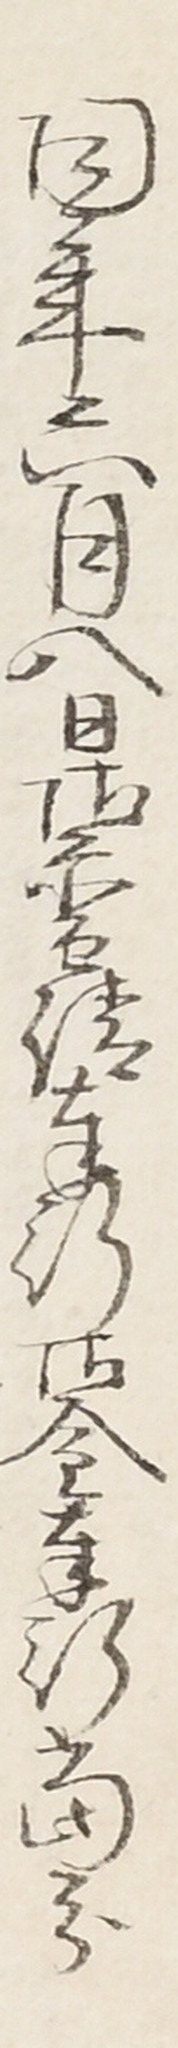一同年六月八日御普請奉行御金奉行当分
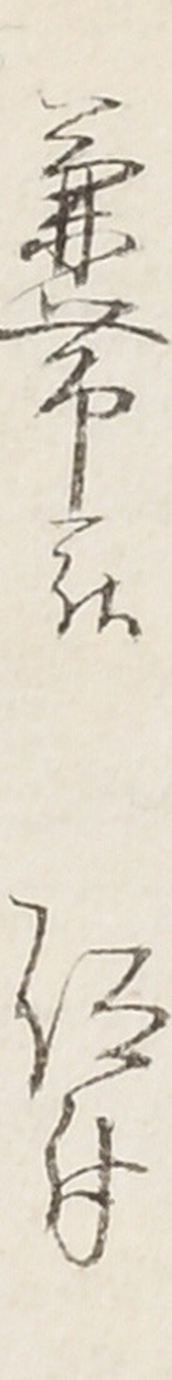兼帯被仰付
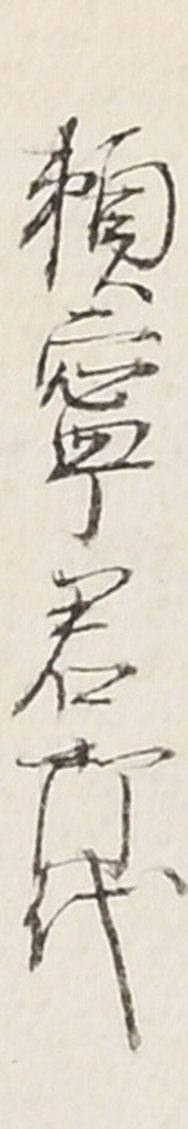頼寧君御代
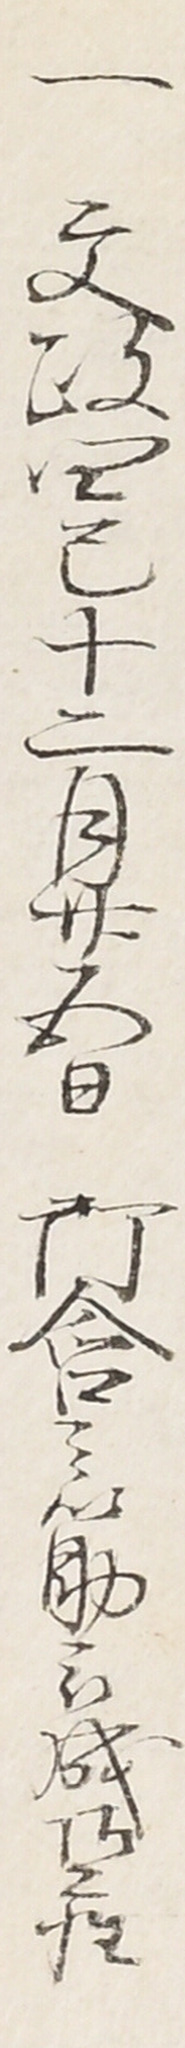一文政四巳十二月廿五日御含之筋被成御座
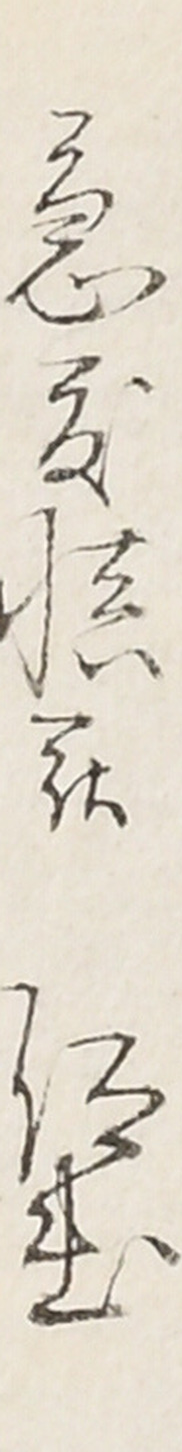急度慎被仰出
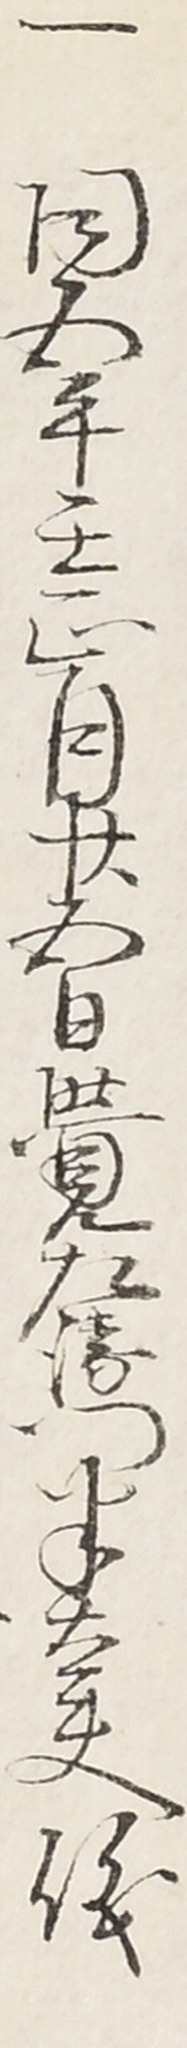一同五午閏正月廿五日覚左衛門半太夫儀
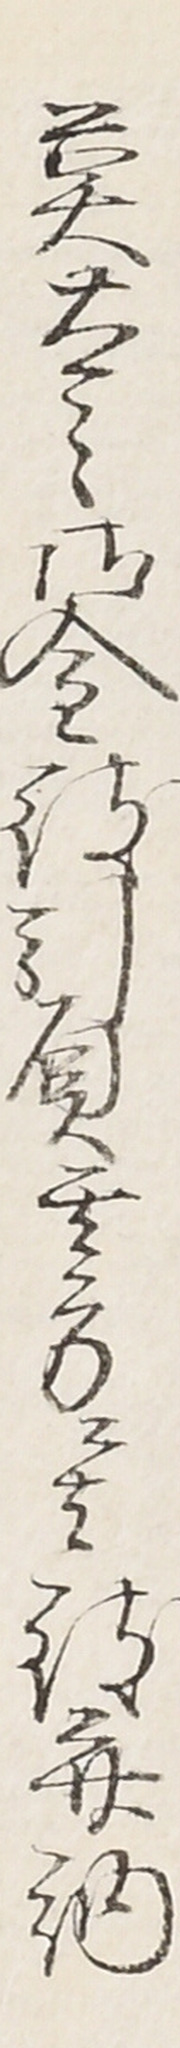莫太之御金致引負其方ニは致弁納
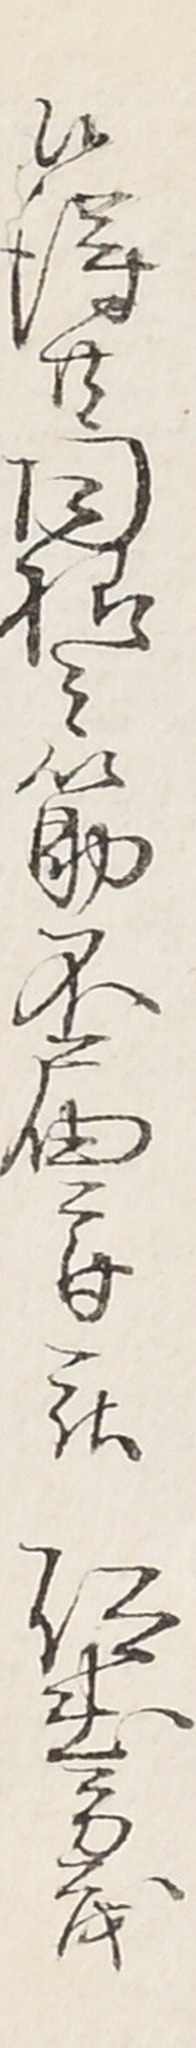候得共同様之筋不届ニ付被仰出方も
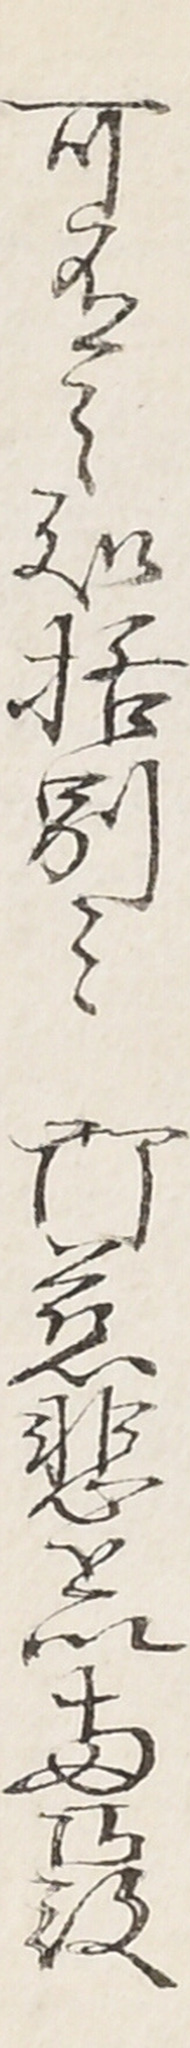可有之処格別之御慈悲を以後両御役
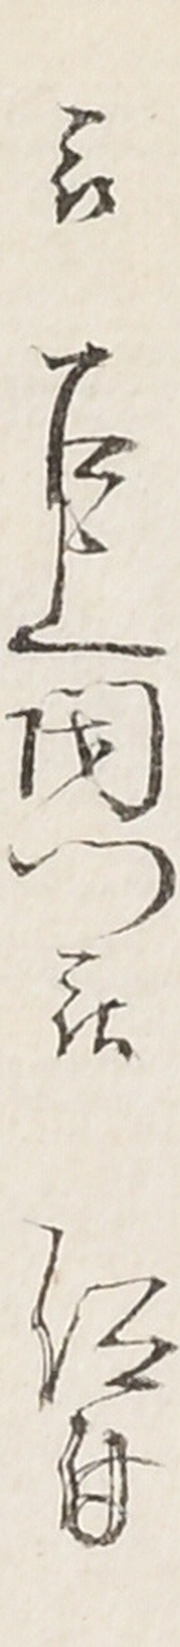被召上閉門被仰付
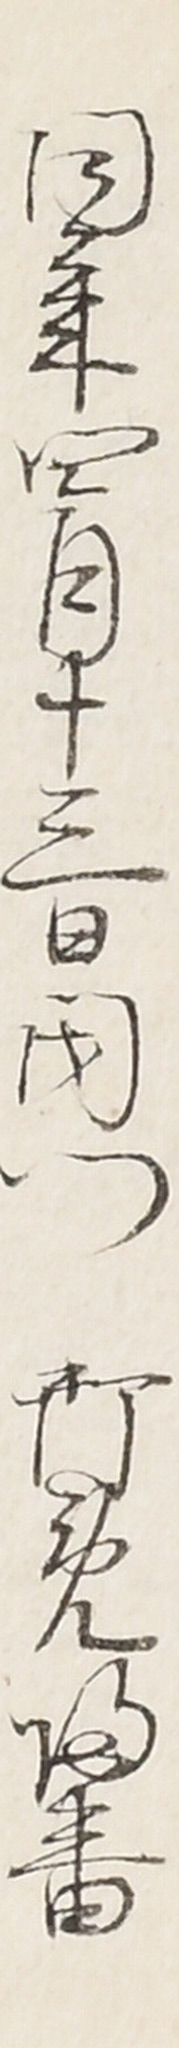一同年四月十三日閉門御免帰番
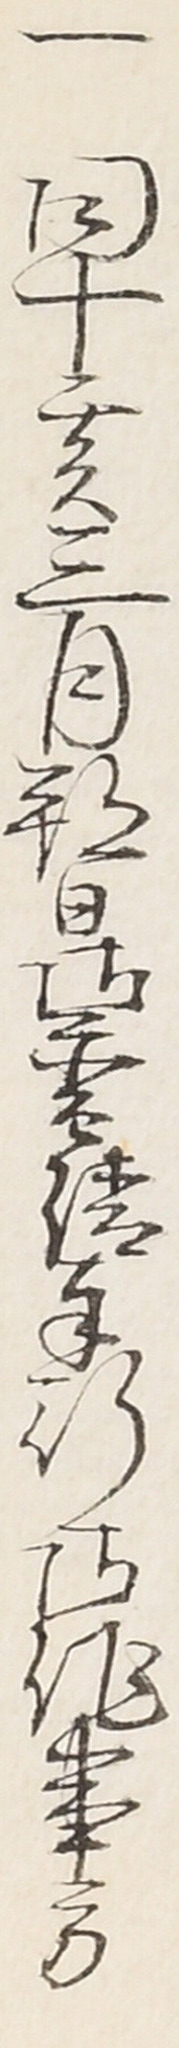一同十亥三月朔日御普請奉行御作事方
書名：給人諸士勤仕録（七）
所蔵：伊那市立高遠町図書館・合同会社AMANE
